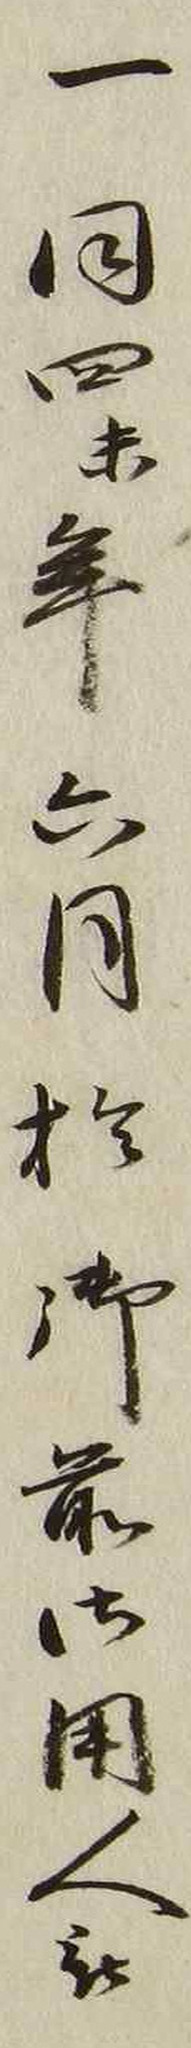一同四未年六月於御前御用人被
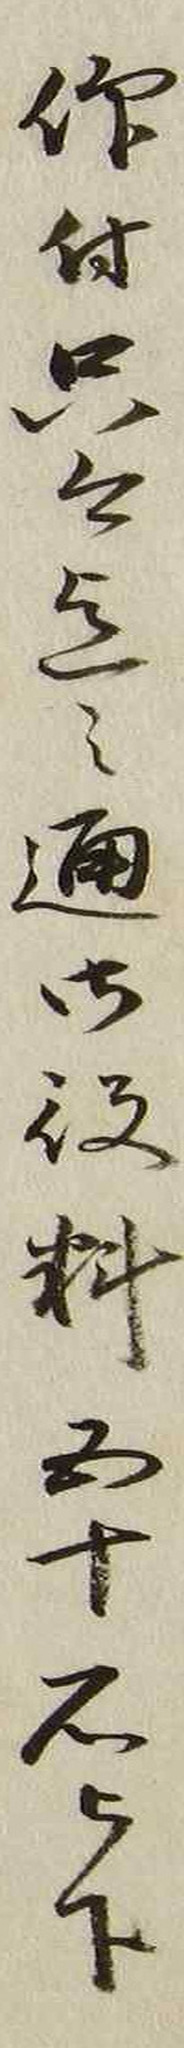仰付只今迄之通御役料五十石被下
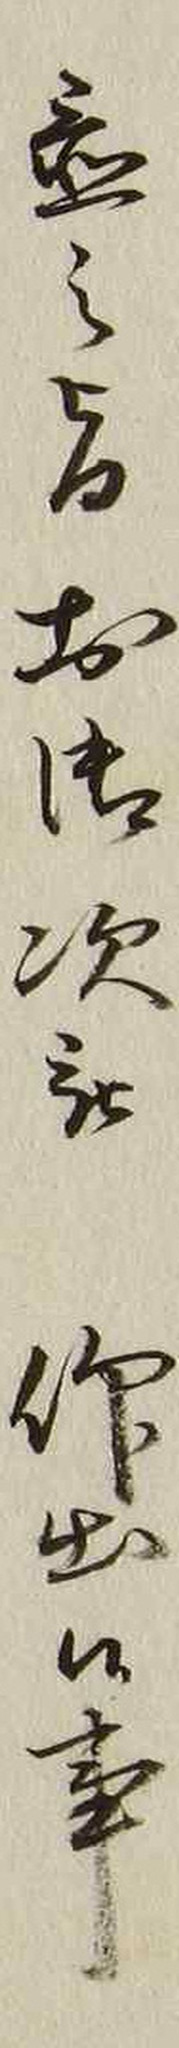置之旨於御次被仰出候事
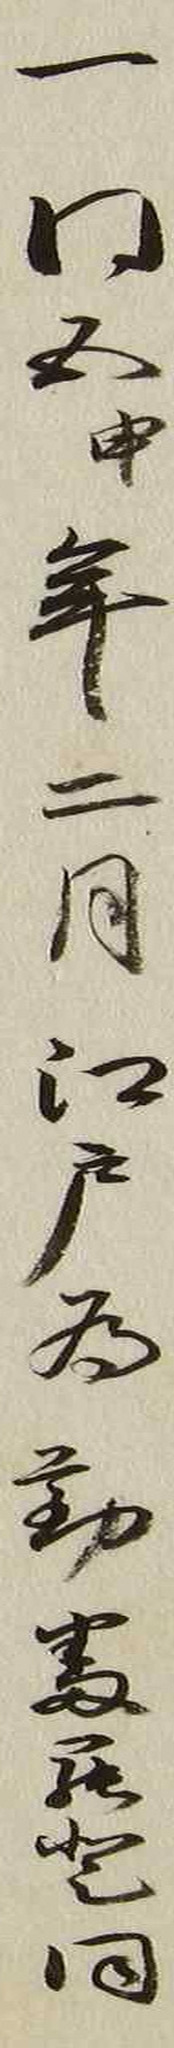一同五申年二月江戸為勤番罷登同
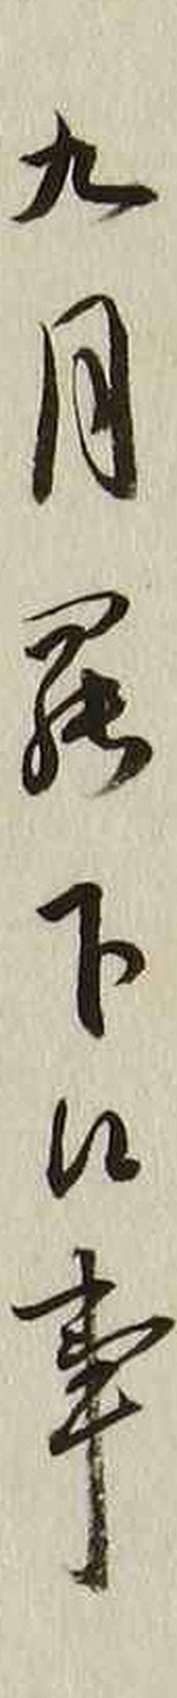九月罷下候事
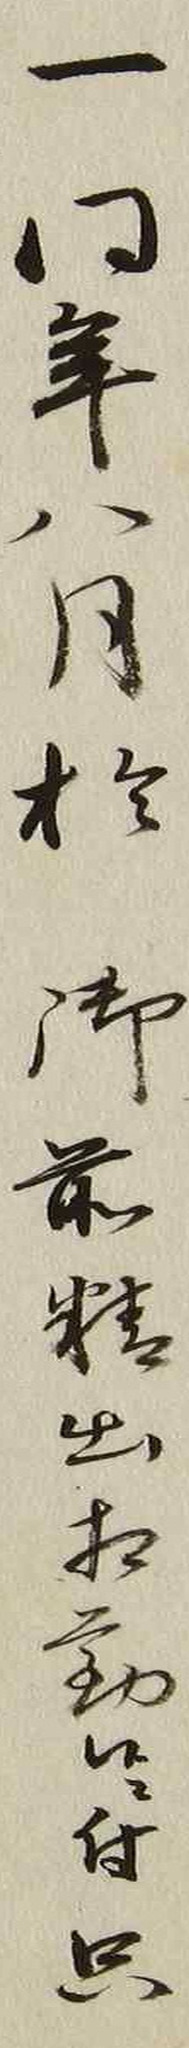一同年八月於御前精出相勤候ニ付只
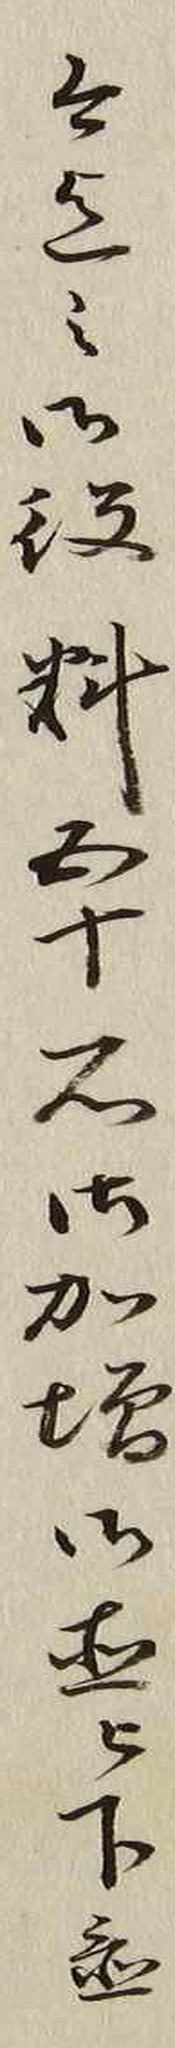今迄之御役料五十石御加増御直被下置
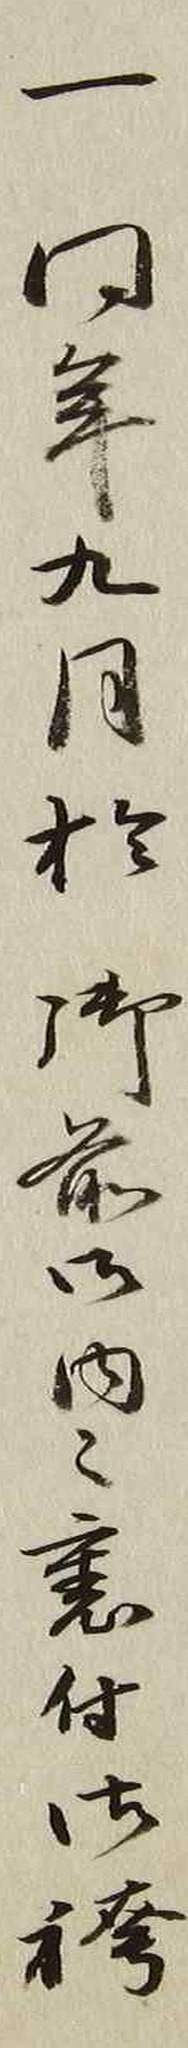一同年九月於御前御内々裏付御袴
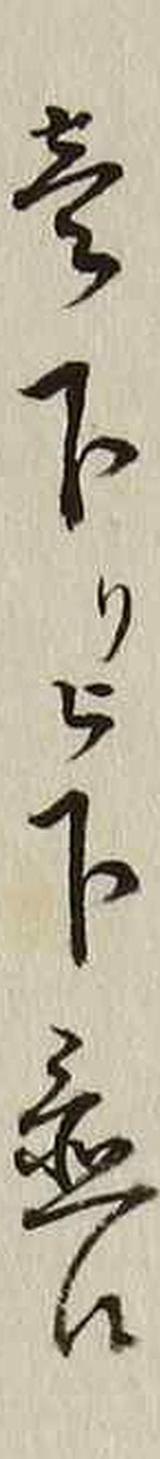壱下り被下置候
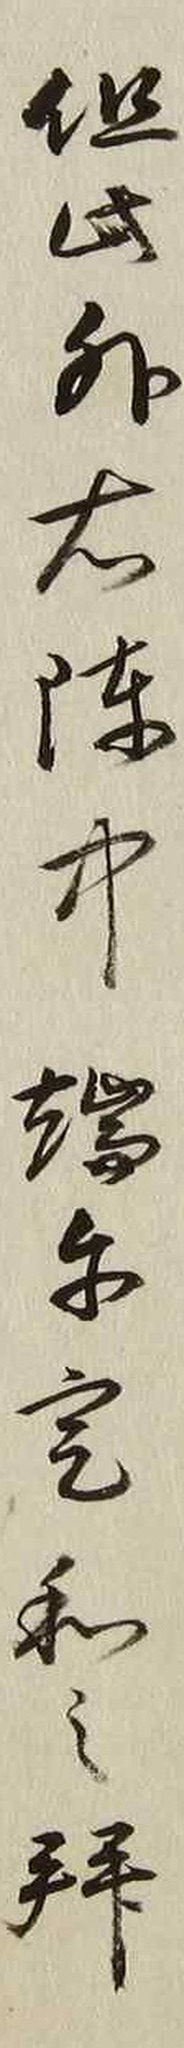但此外右陣中端午定和之拝
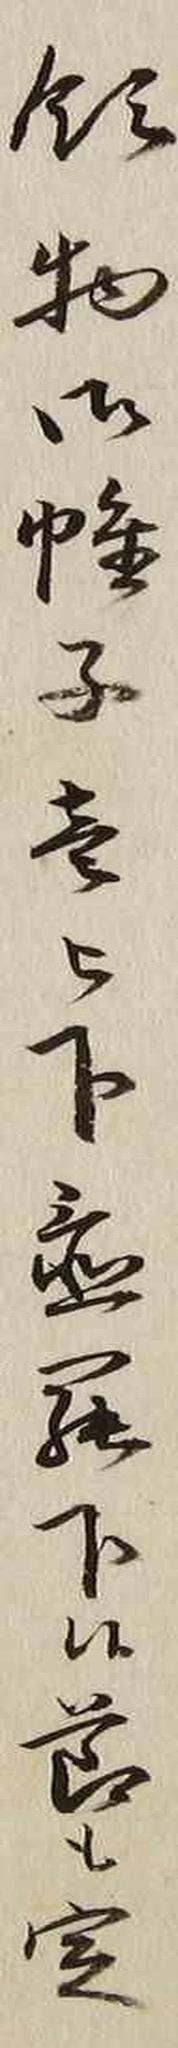領物御帷子壱被下置罷下候節も定
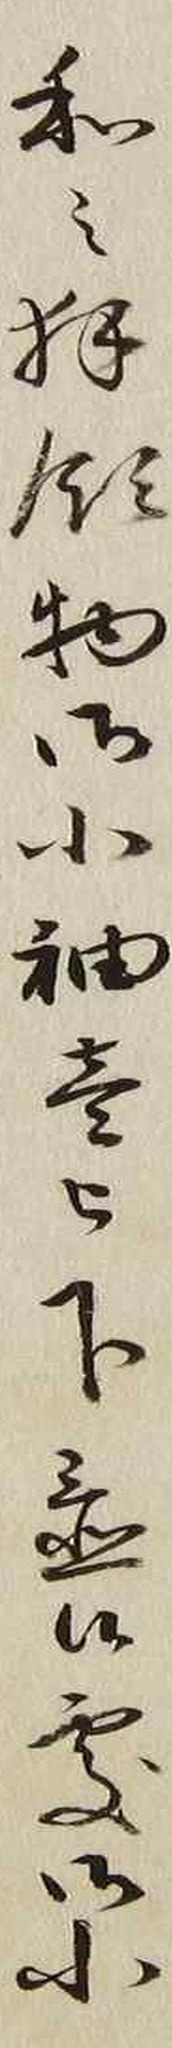和之拝領物御小袖壱被下置候処御小
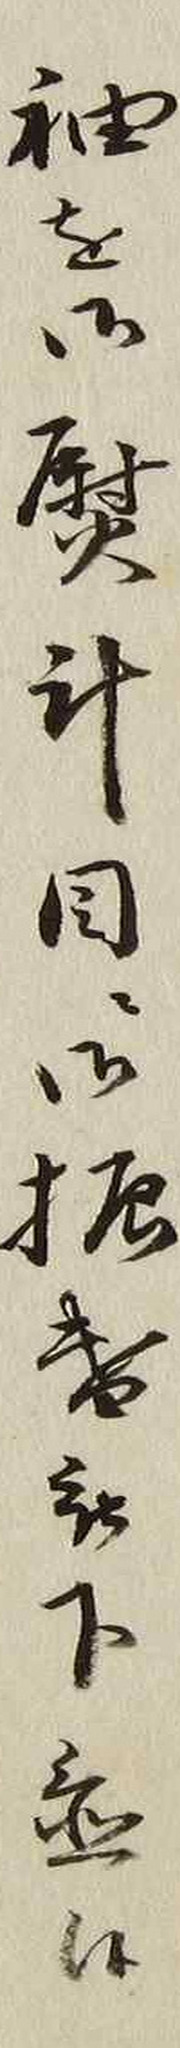袖を御熨斗目ニ御振替被下置候
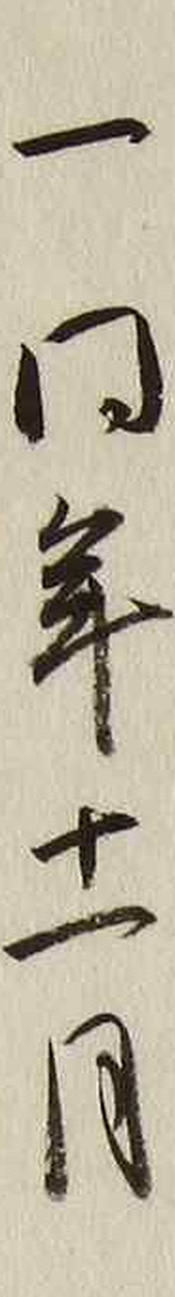一同年十一月
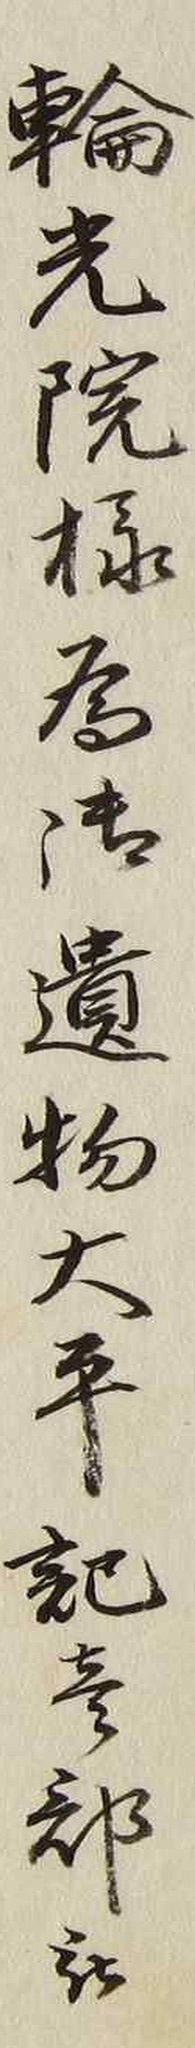輪光院様為御遺物大平記壱部被
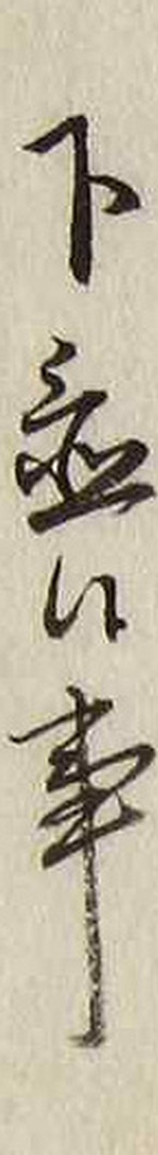下置候事
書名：諸士系譜　巻之160　な之部2
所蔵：会津若松市立会津図書館
